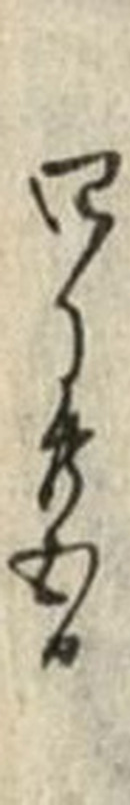四月廿五日
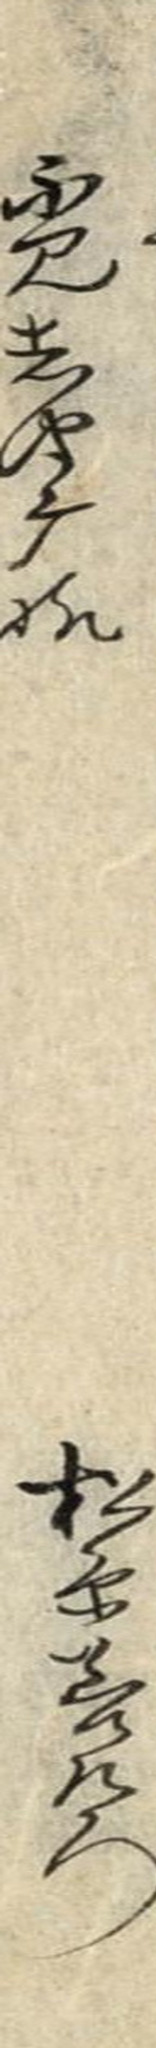永見志津摩様松原善左衛門
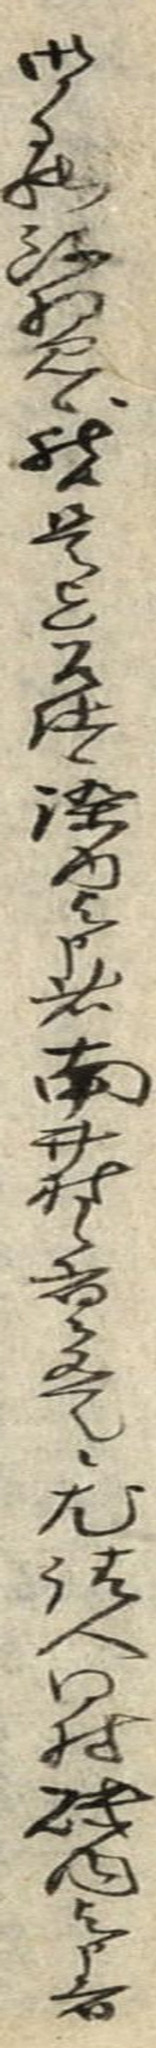御手紙致拝見候然は是迄召仕候染内と申者南井村之者に有之候尤請人同村磯内と申者
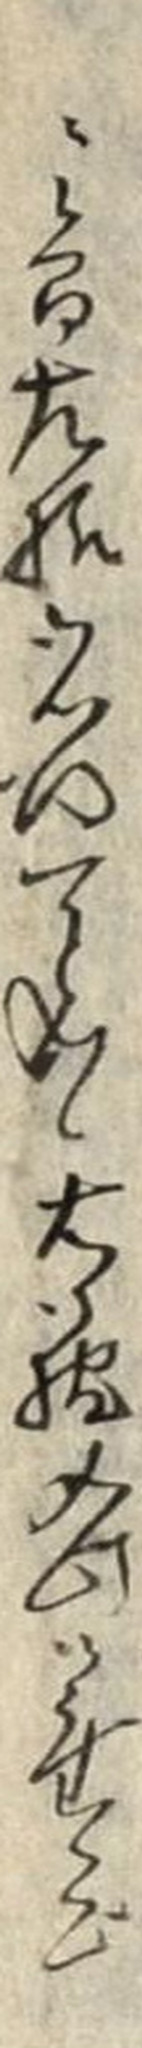に候間左様御心得可被成候右御報如此御座候以上
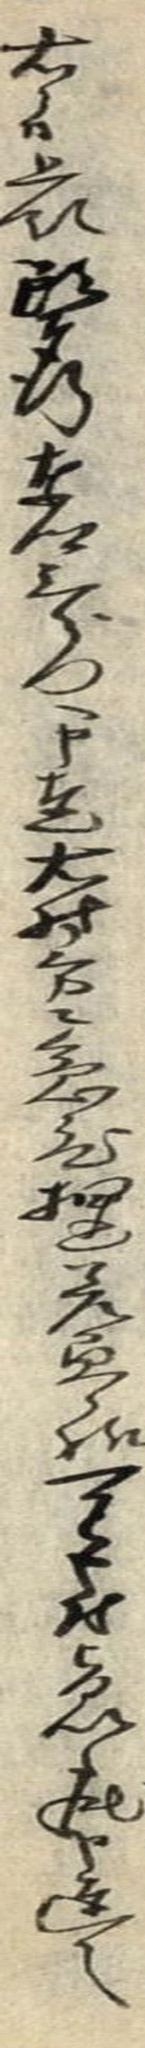右に付上領郡奉行東郷三郎右衛門へ申達右村方に急度押込差置候様可被申付候旨以手紙申達之
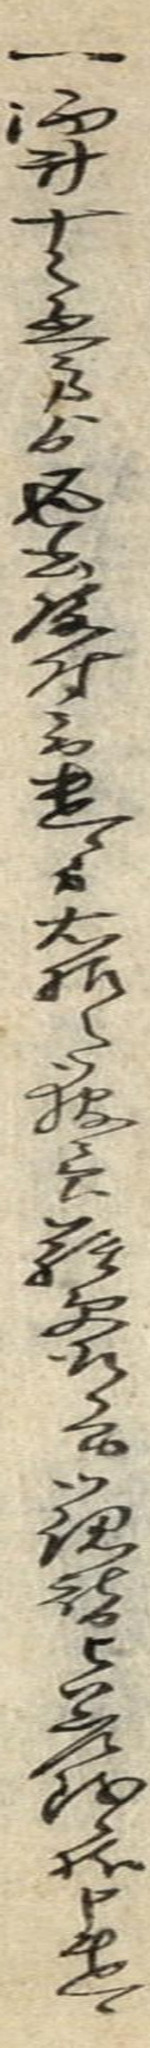一酒井十之丞方ゟ返書殿付に而遣候に付右様之御報に而は難受取候間御認替被差越候様申遣候
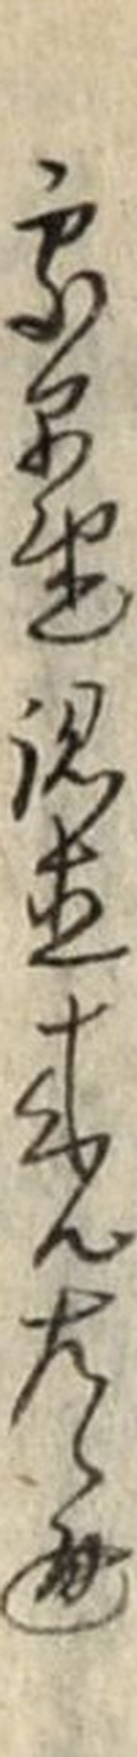処早速認直来る左之通
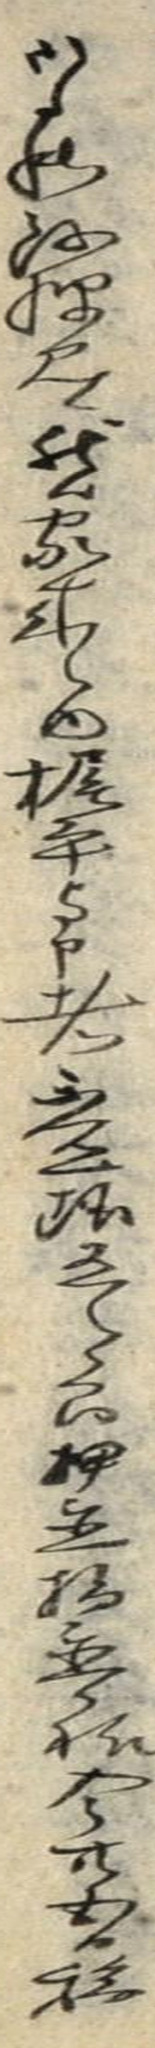御手紙致拝見候然は家来之内梶平と申者不宜趣有之候間押置指置候様今廿五日ゟ稻

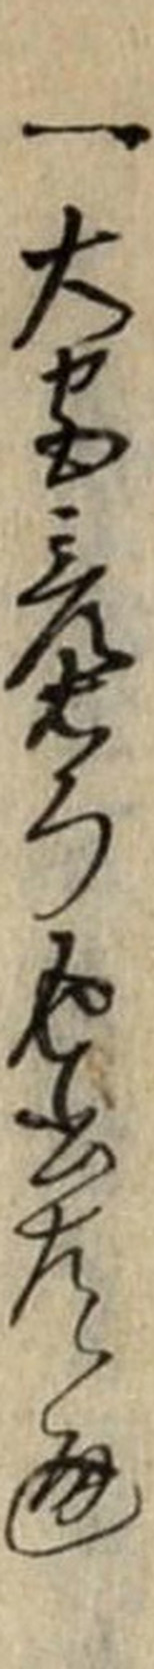一笹治権右衛門方返書左之通
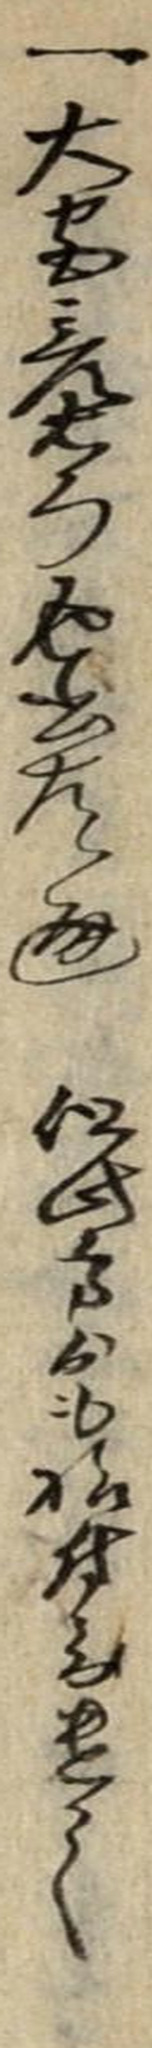一大宮彦右衛門返書左之通但此方ゟも様付に而遣之
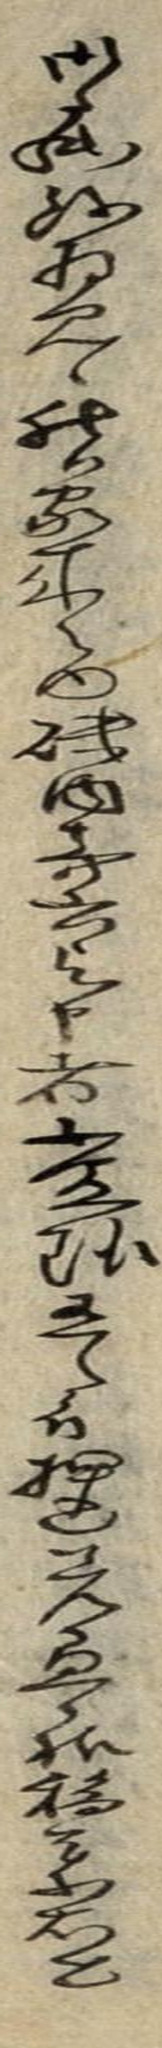御手紙致拝見候然は家来之内磯内喜六と申者不宜趣有之候付押込差置候様稻葉右近
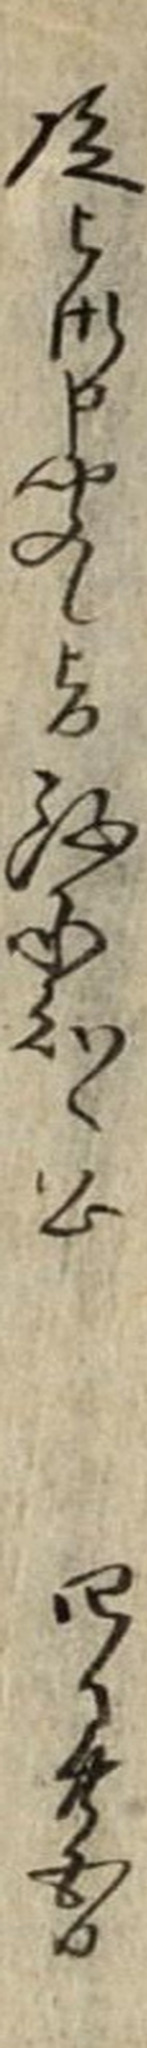殿被御申聞候旨致承知候以上四月廿五日
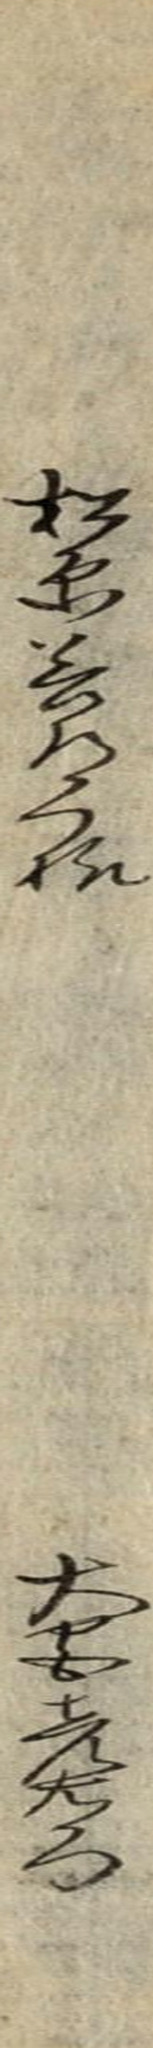松原善左衛門様大宮彦右衛門
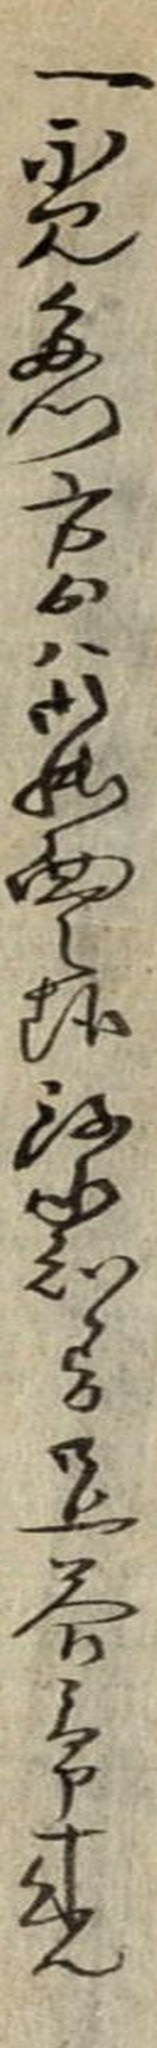一永見多門方ゟは御紙面之趣致承知候旨口上答に而申来る
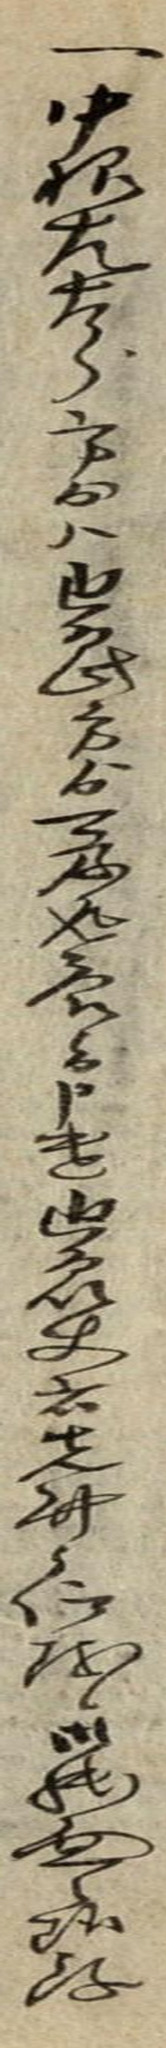一中根左太郎方ゟは追而此方ゟ可及返答候旨申遣追而以使者先刻被仰越候御紙面之趣致
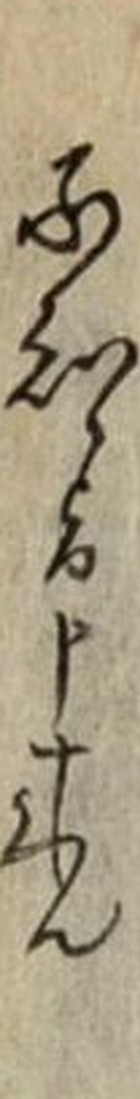承知候旨申来る
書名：蒐輯之部
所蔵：福井県文書館 Fukui Prefectural Archives
